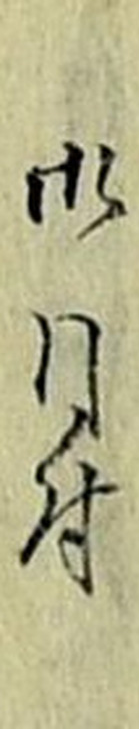御目付
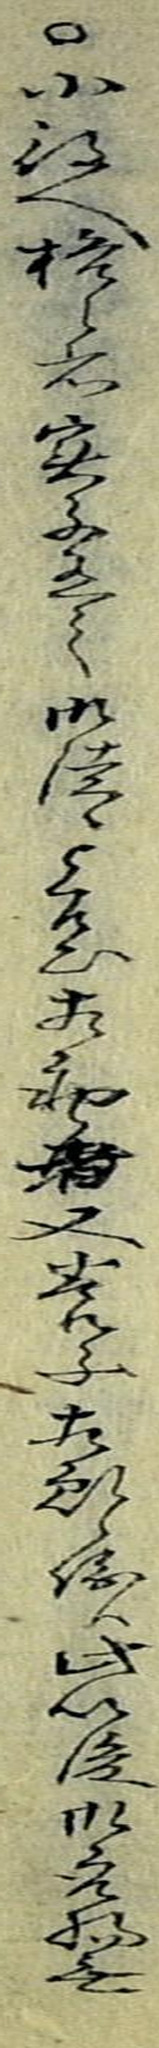〇小役人格之者実子有之御徒へ被召出相勤候者又養子相願候儀ハ此以後御取揚無
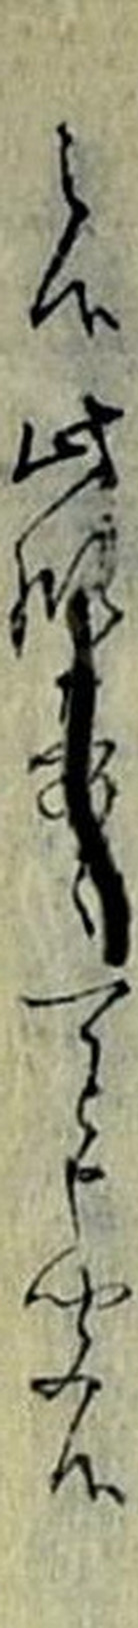之候此段寄々可被申聞候
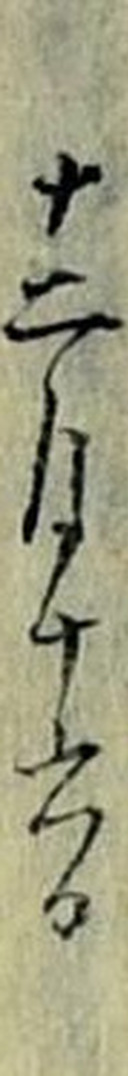十二月十六日

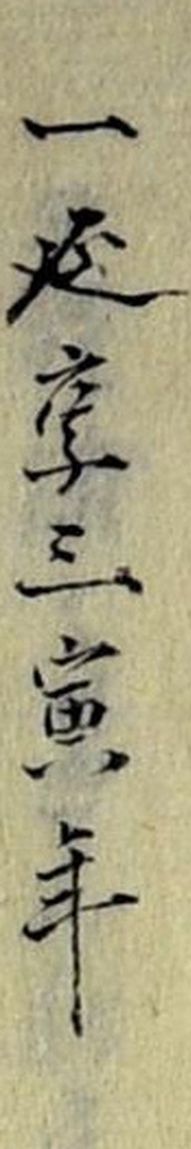一延享三寅年
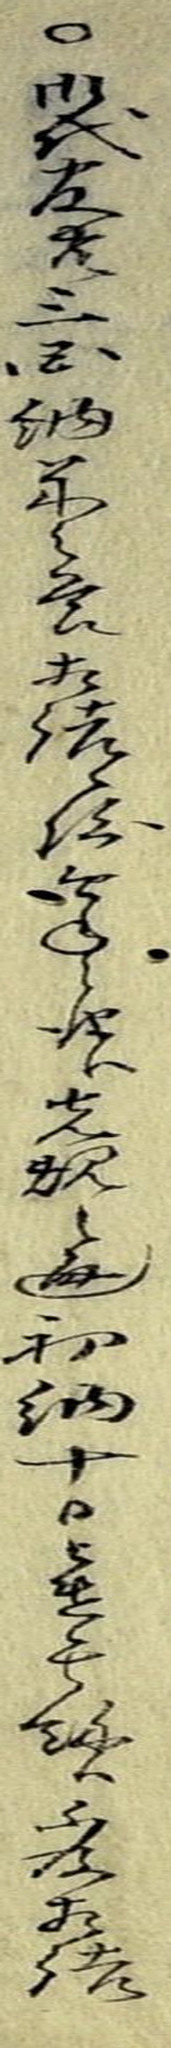〇御代官共三国納米之節相詰候儀今年之儀ハ先規之通初納十日被遣其余ハ不及相詰
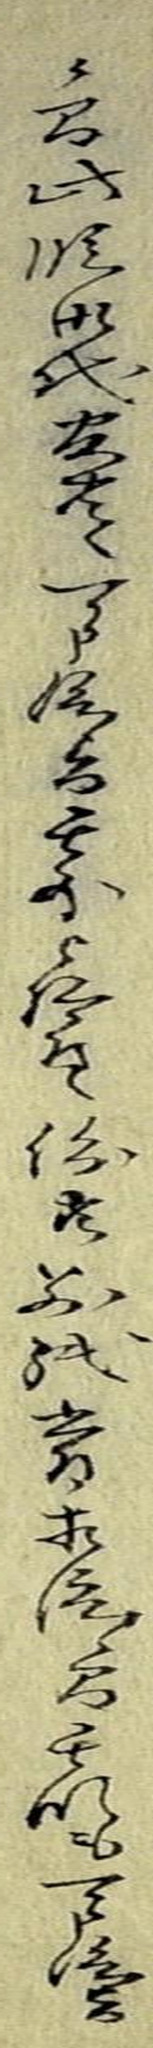候間此段御代官共へ可申渡旨其外被仰付候儀共別紙書付相渡候間其段も可申渡旨
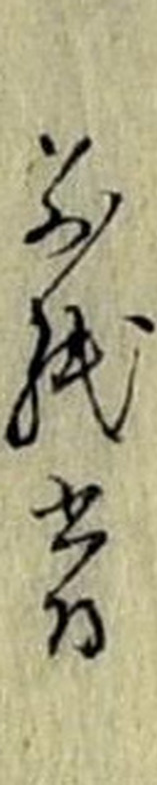別紙書付
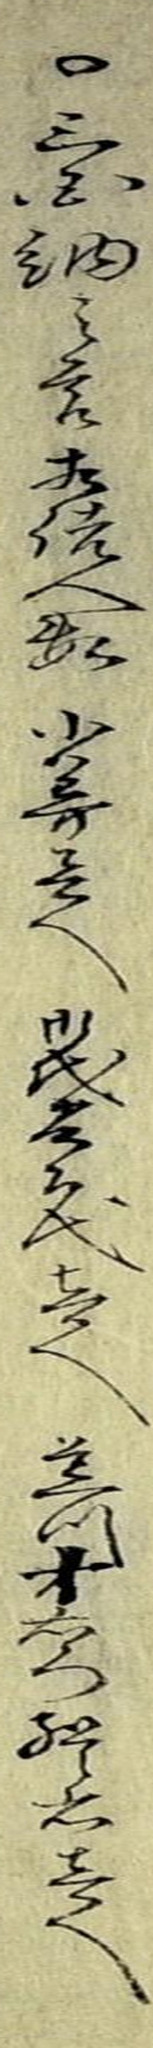〇三国納之節相詰人数小算壱人御代官下代壱人荒川十右衛門組之者壱人
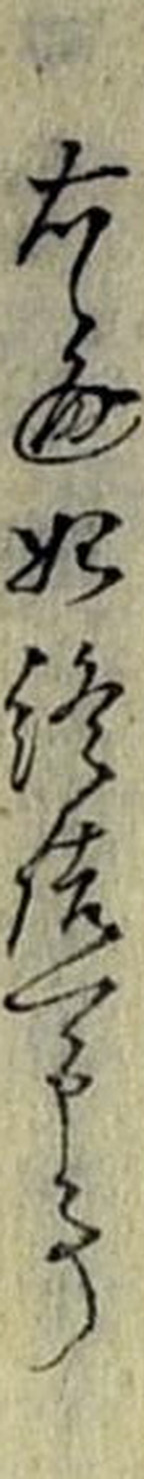右之通始終詰可申事
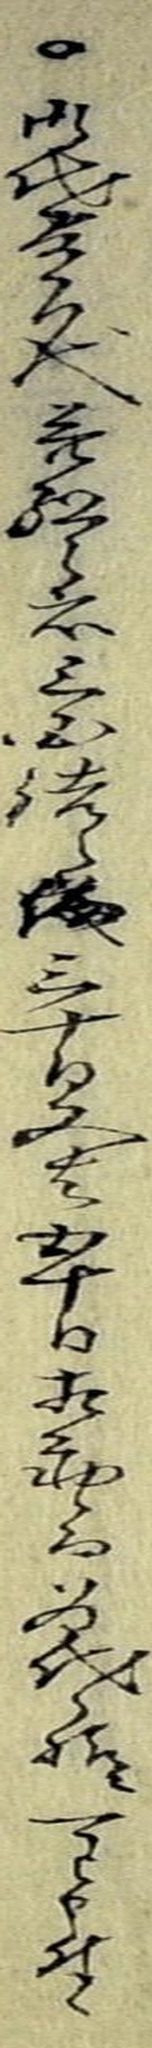〇御代官下代并組之者三国詰之儀三十日又者五十日相勤候而為代候様ニ可被申付候
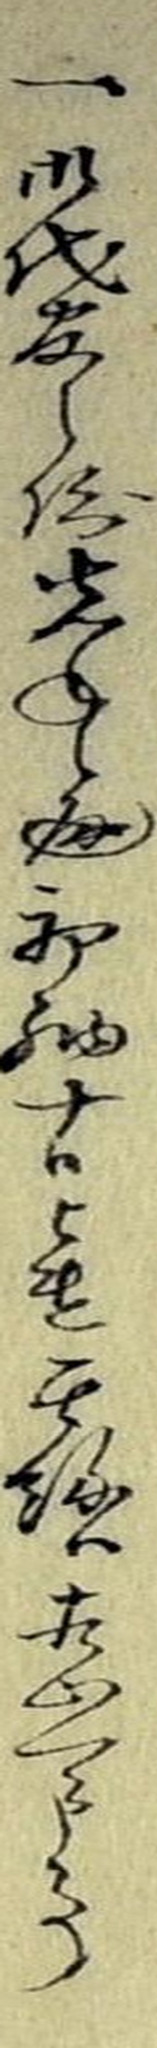一御代官之儀先年之通初納十日被遣其余ハ相止可申事
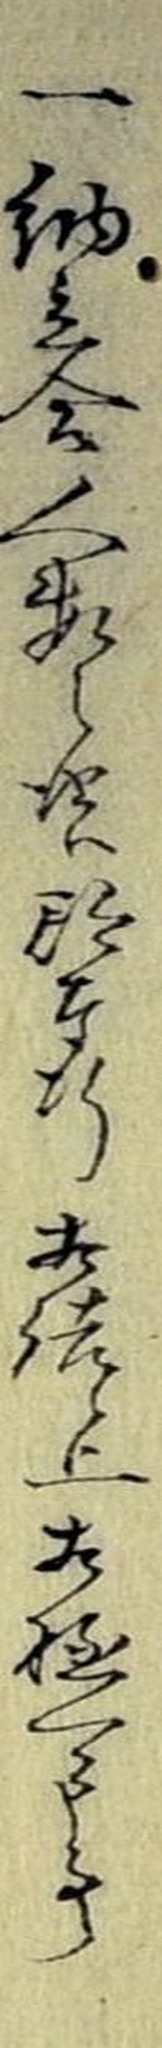一納立合人数之儀ハ郡奉行相詰候上相極可申事
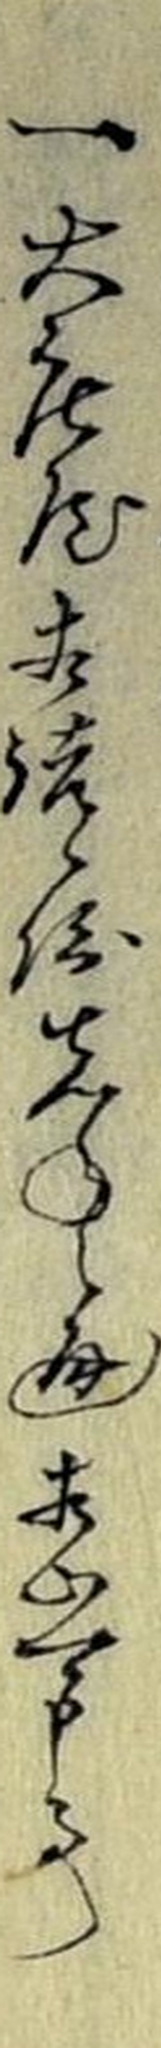一大庄屋相詰候儀先年之通相止可申事
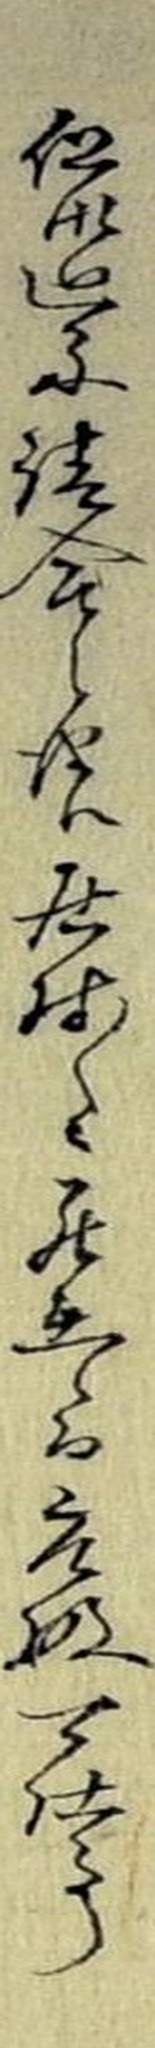但御廻米請合之儀ハ居村々ニ罷在候而取扱可仕事
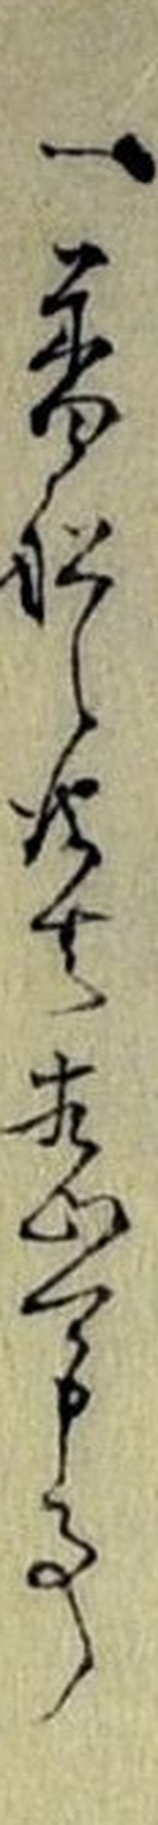一番船之儀者相止可申事
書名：命令之部 一
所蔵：福井県文書館 Fukui Prefectural Archives
